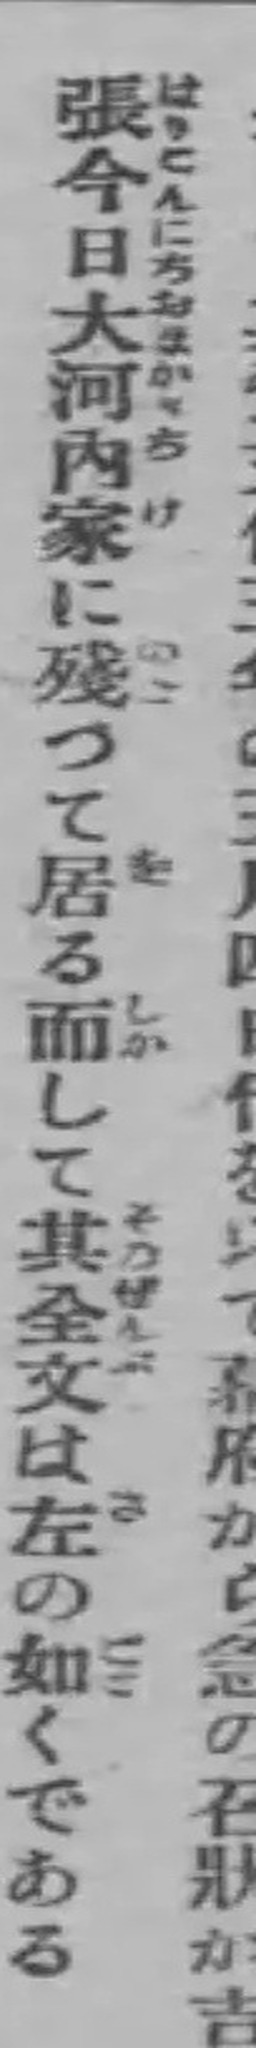張今日大河内家に残つて居る而して其全文は左の如くである
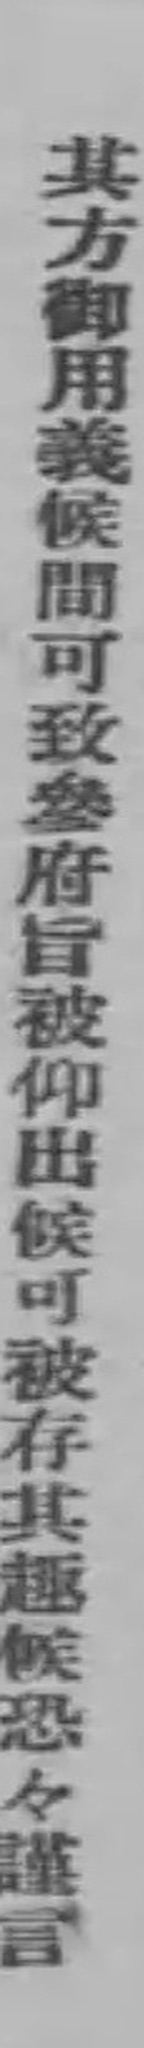其方御用義候間可致参府旨被仰出候可被存其趣候恐々謹言
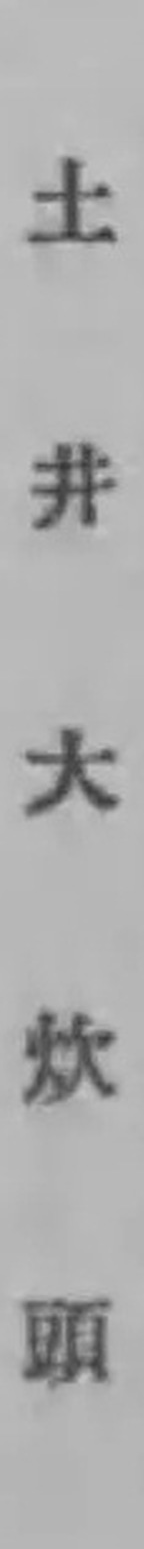土井大炊頭
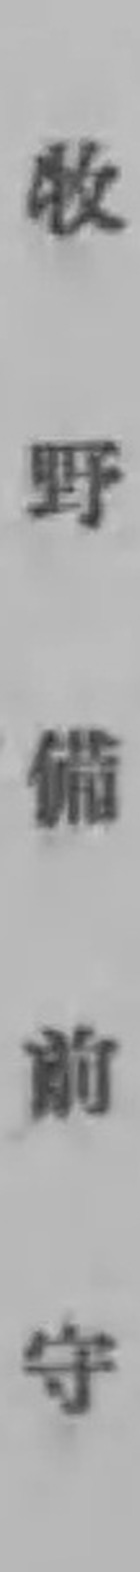牧野備前守
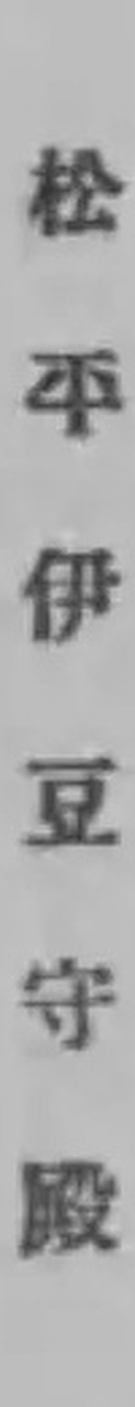松平伊豆守殿
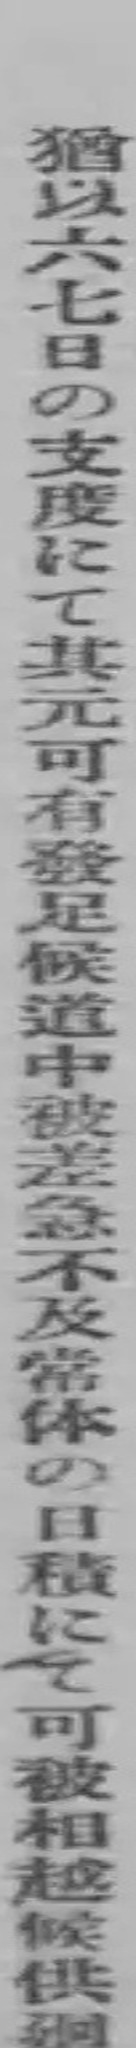猶以六七日の支度にて其元可有発足候道中被差急不及常体の日積にて可被相越候供廻
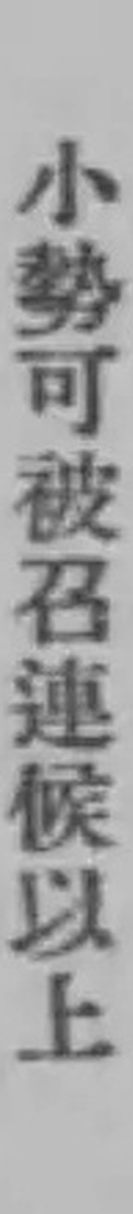小勢可被召連候以上
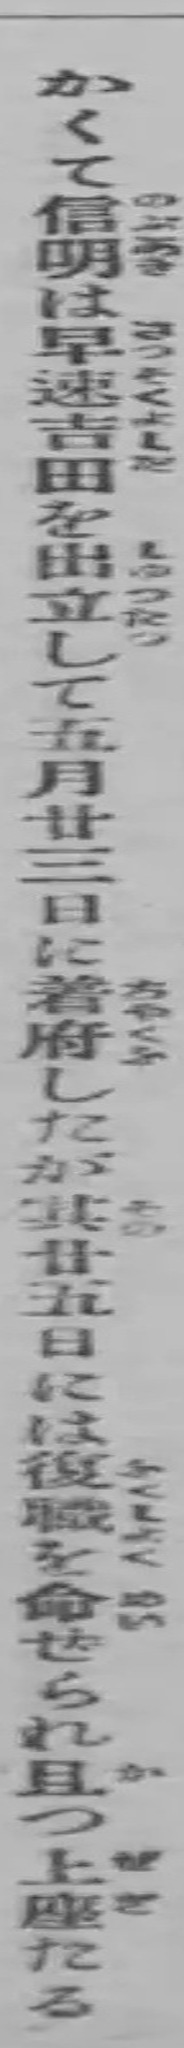かくて信明は早速吉田を出立して五月廿三日に着府したが其廿五日には復職を命ぜられ且つ上座たる
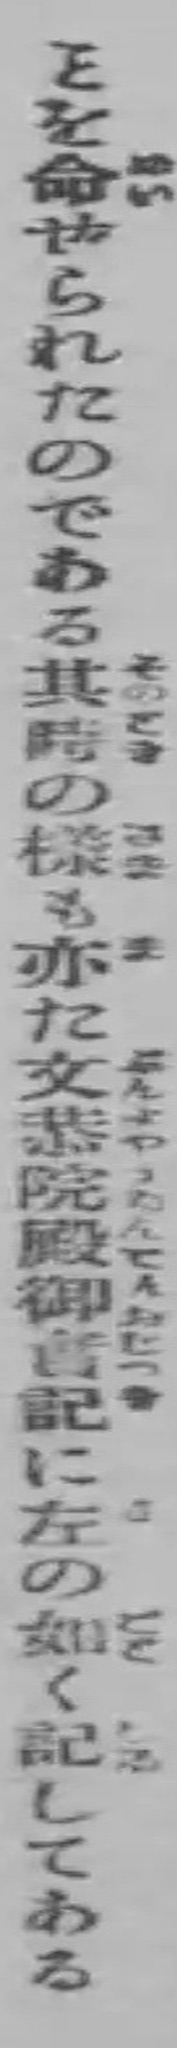ことを命ぜられたのである其時の様も亦た文恭院殿御実記に左の如く記してある
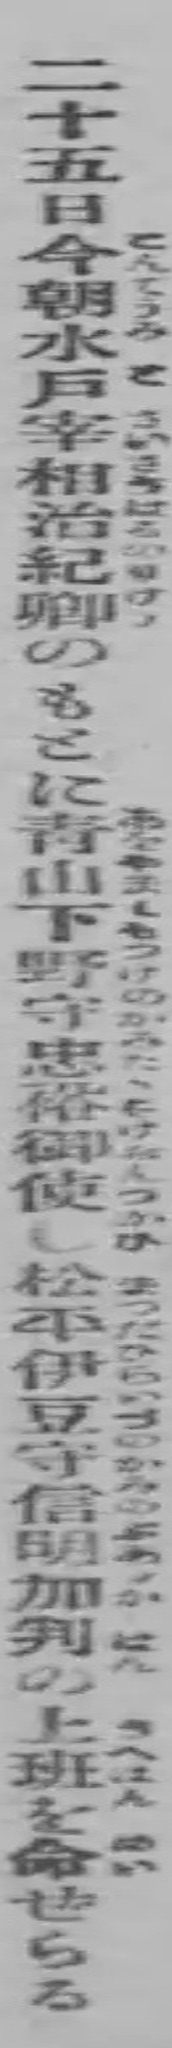二十五日今朝水戸宰相治紀卿のもとに青山下野守忠裕御使し松平伊豆守信明加判の上班を命ぜらる
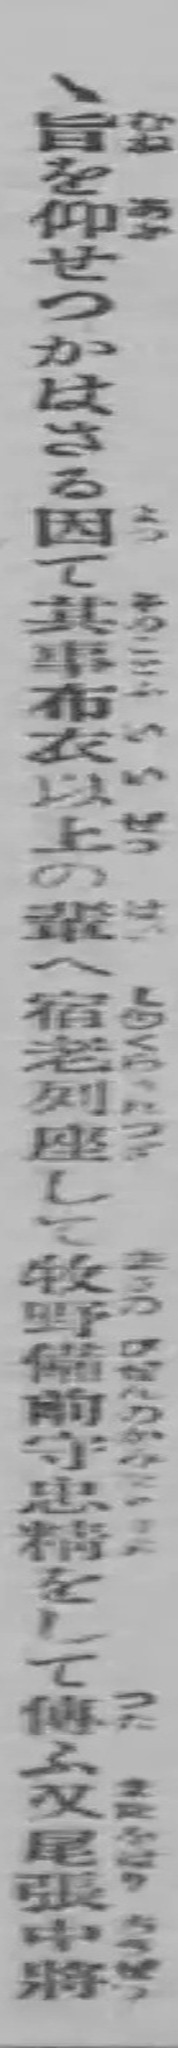ゝ旨を仰せつかはさる因て其事布衣以上の輩へ宿老列座して牧野備前守忠精をして伝ふ又尾張中将
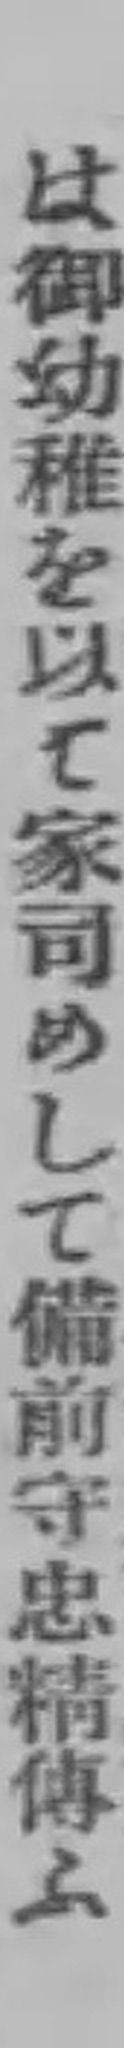は御幼稚を以て家司めして備前守忠精伝ふ
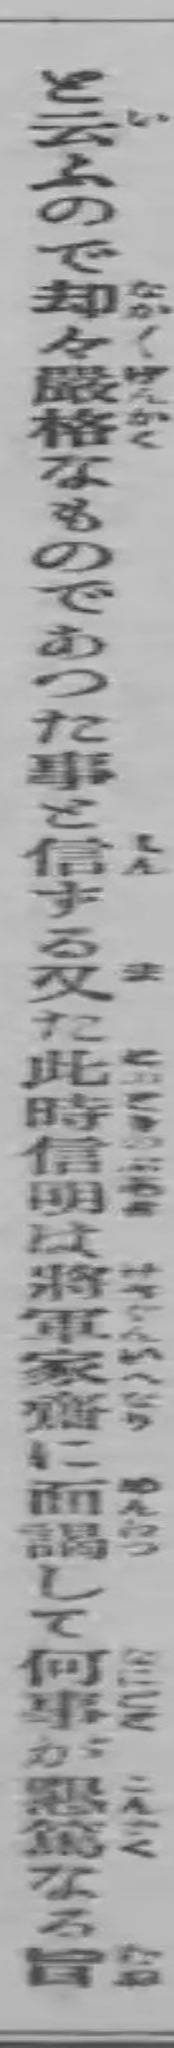と云ふので却々厳格なものであつた事と信ずる又た此時信明は将軍家斉に面謁して何事か懇篤なる旨
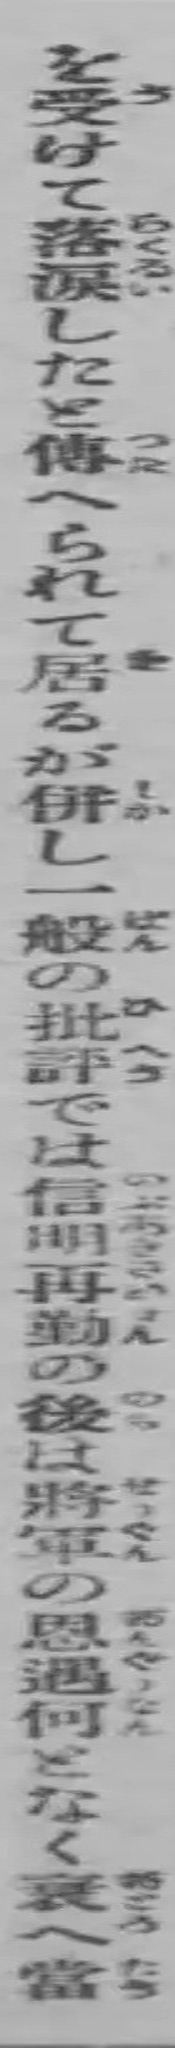を受けて落涙したと伝へられて居るが併し一般の批評では信明再勤の後は将軍の恩遇何となく衰へ当
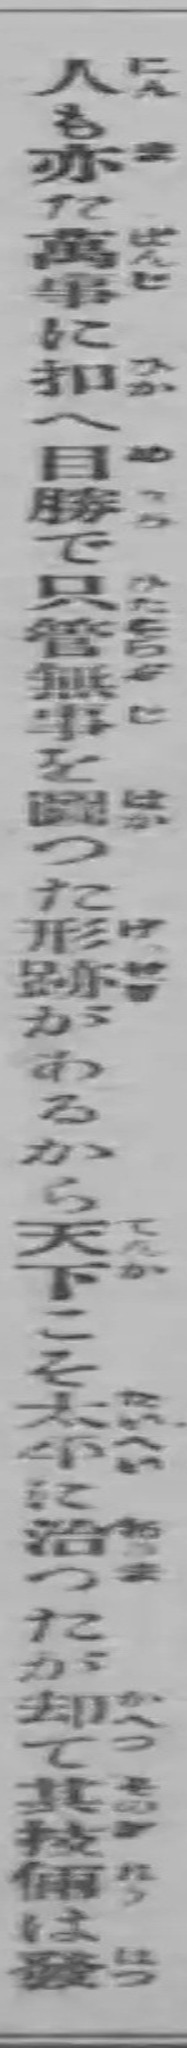人も亦た万事に扣へ目勝で只管無事を図つた形跡があるから天下こそ太平に治つたが却て其技倆は発
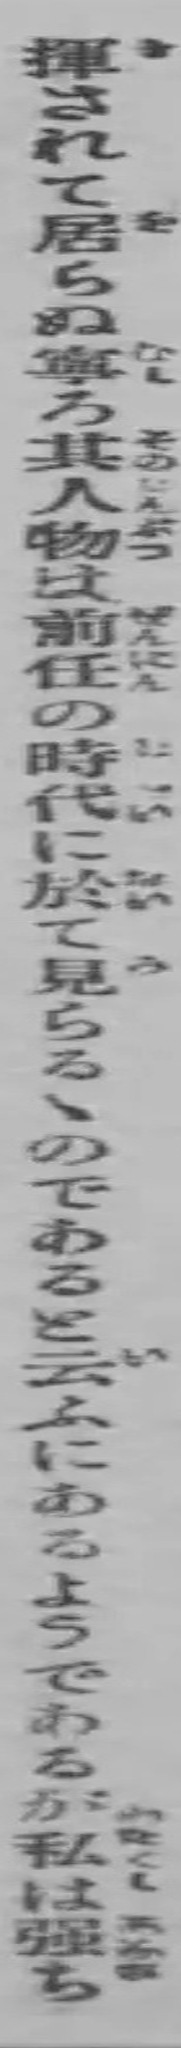揮されて居らぬ寧ろ其人物は前任の時代に於て見らるゝのであると云ふにあるようであるが私は強ち
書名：豊橋市史談
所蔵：国立国会図書館 National Diet Library, JAPAN
